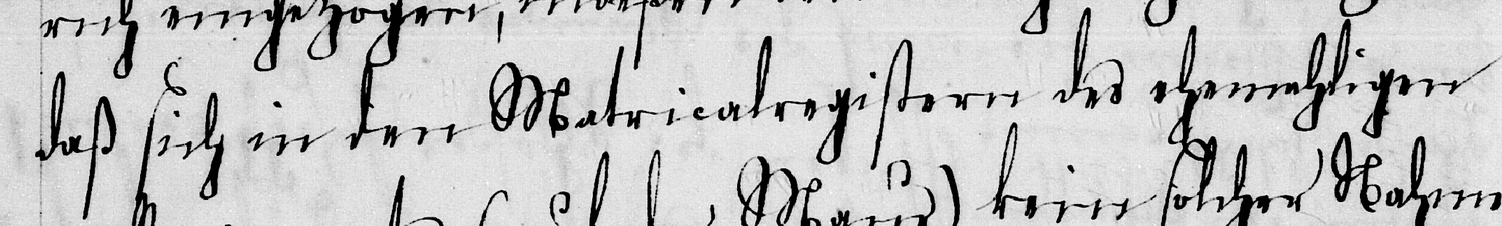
daß sich in den Matricalregistern des ehemaligen
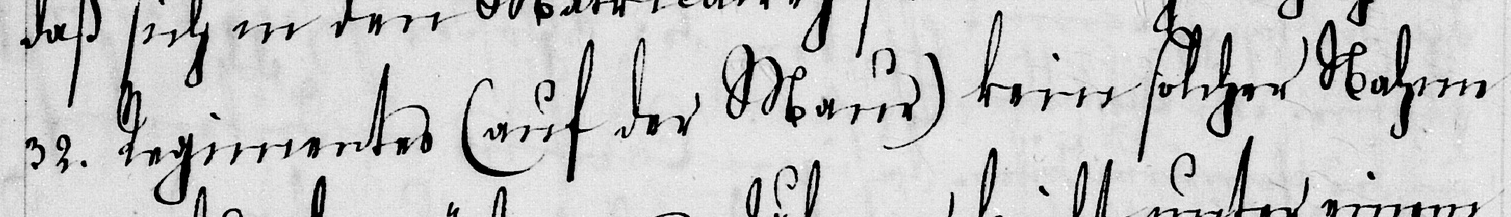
32. Regiments (auf der Maur) kein solcher Nahme
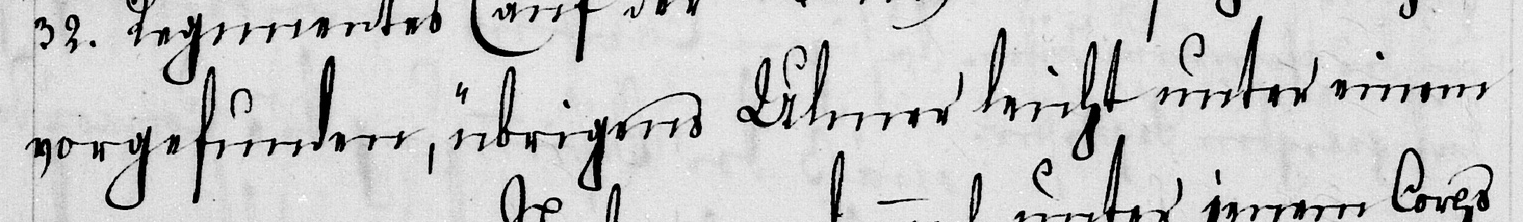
vorgefunden, übrigens Ulmer leicht unter einem
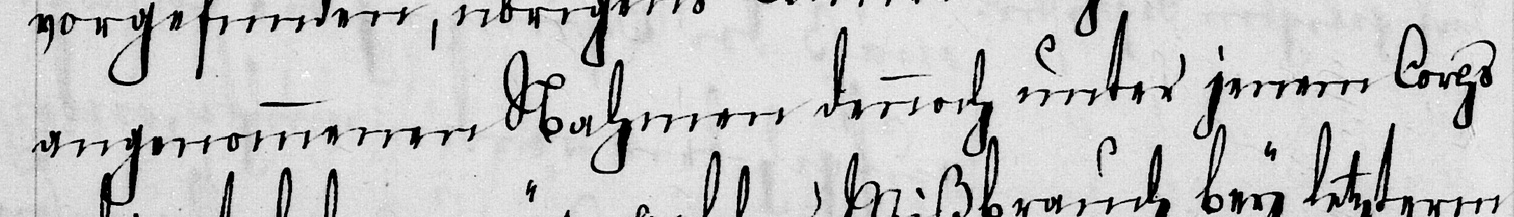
angenommenen Nahmen dennoch unter jenem Corps
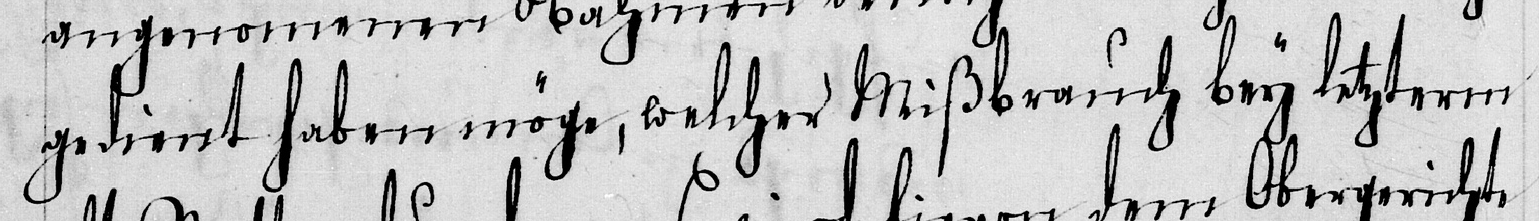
gedient haben möge, welcher Mißbrauch bey letzterm
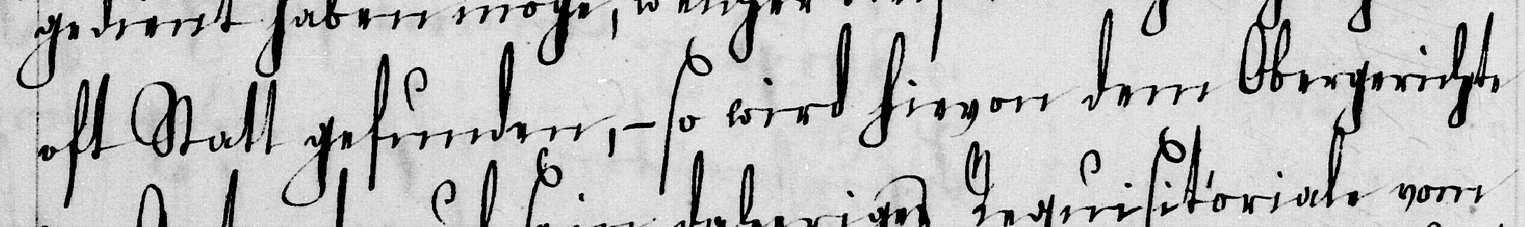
oft Statt gefunden, – so wird hievon dem Obergericht
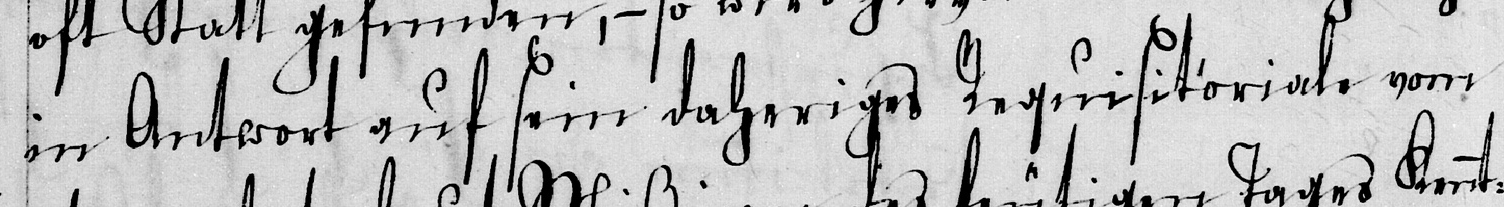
in Antwort auf sein daheriges Requisitoriale vom
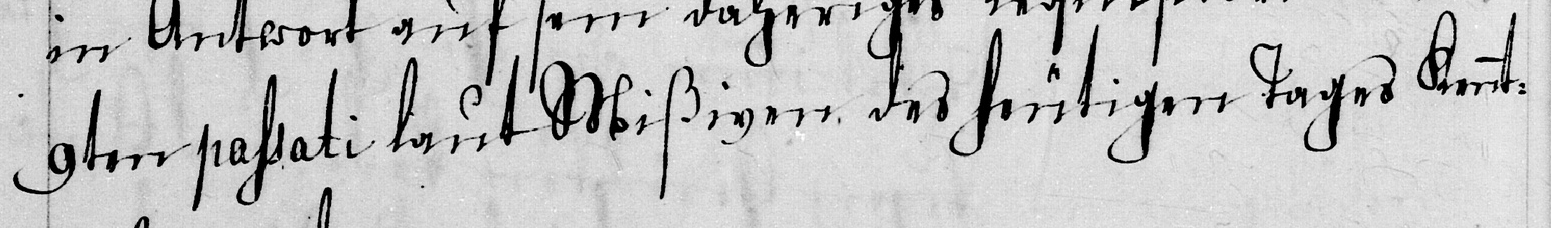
9ten passati lauf Mißiven des heutigen Tages Kenn¬
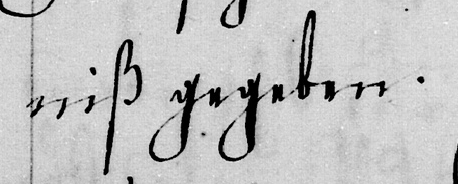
tniß gegeben.
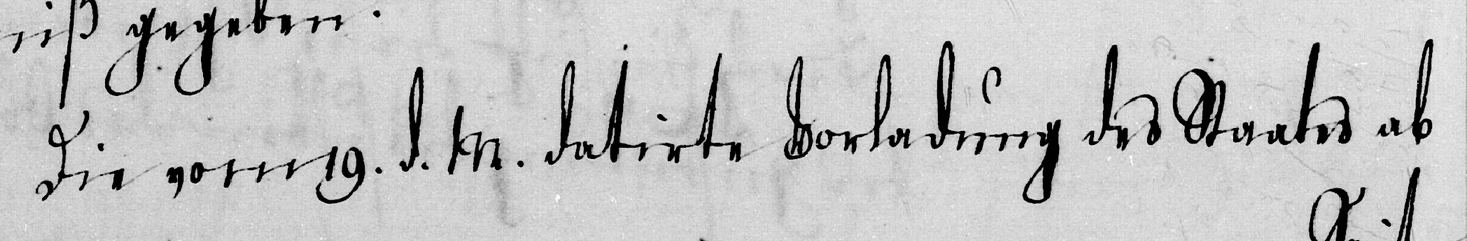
Die vom 19. d. M. datirte Vorladung des Staates ab
